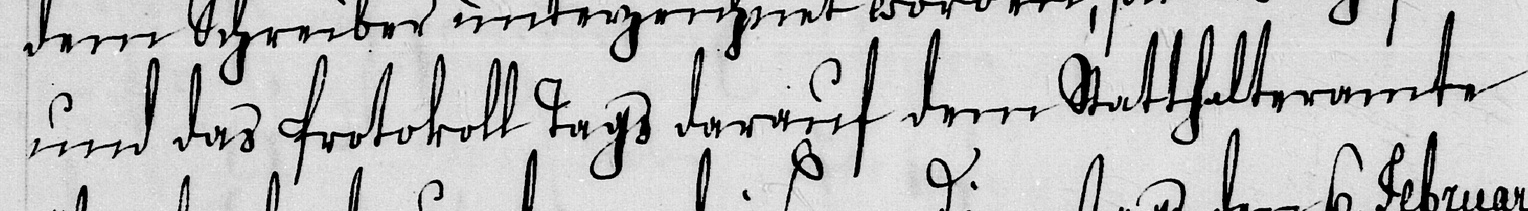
und das Protokoll Tags darauf dem Statthalteramte
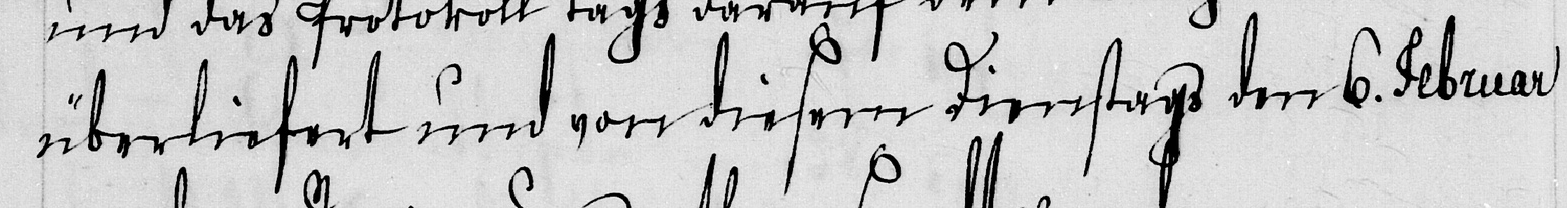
überliefert und von diesem Dienstags den 6. Februar
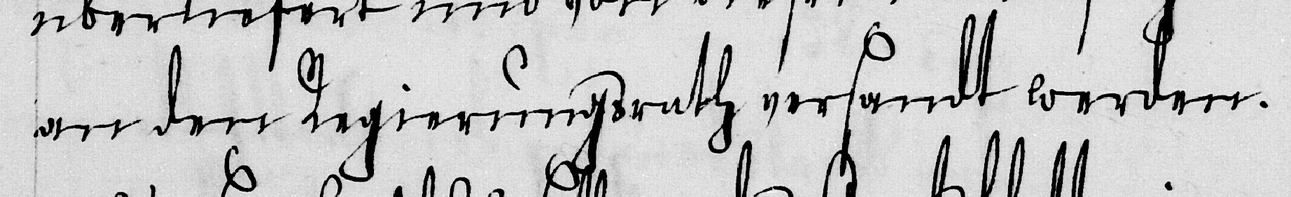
an den Regierungsrath versandt werden.
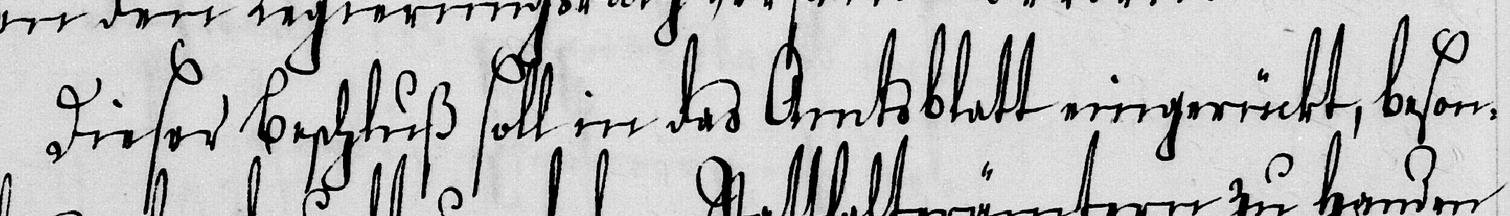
Dieser Beschluß soll in das Amtsblatt eingerückt, be¬
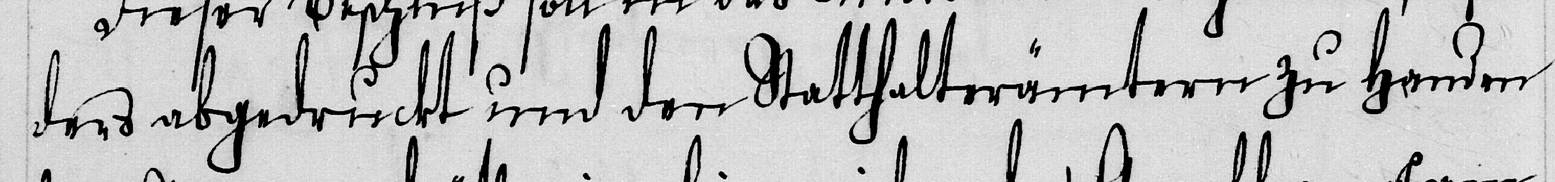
ders abgedruckt und den Statthalterämtern zu Handen
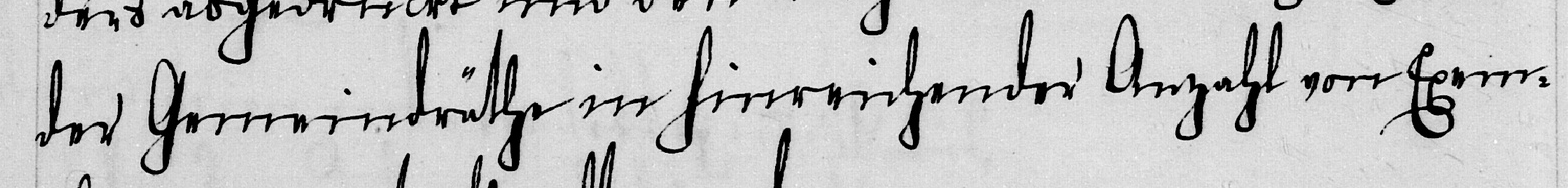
der Gemeindräthe in hinreichender Anzahl von Exem¬
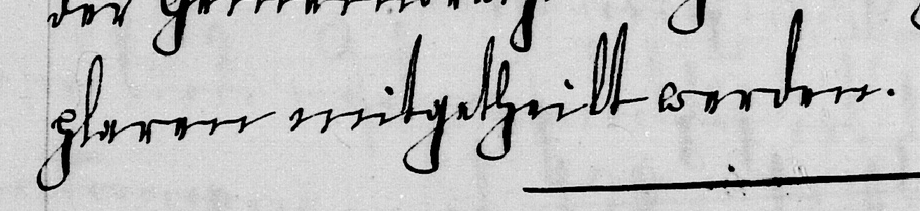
plaren mitgetheilt werden.
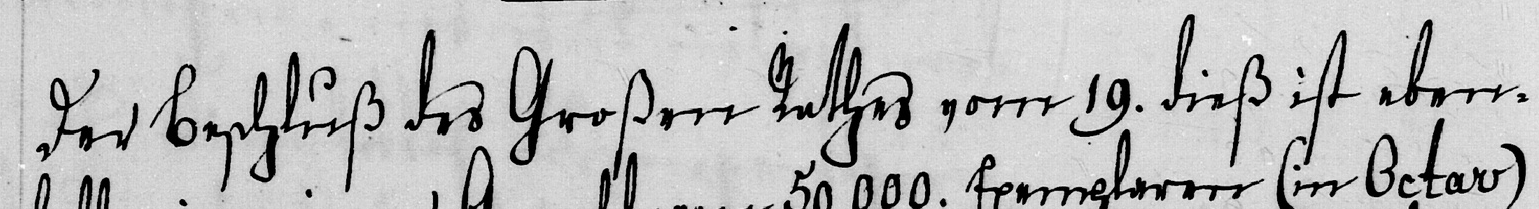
Der Beschluß des Großen Rathes vom 19. dieß ist eben¬
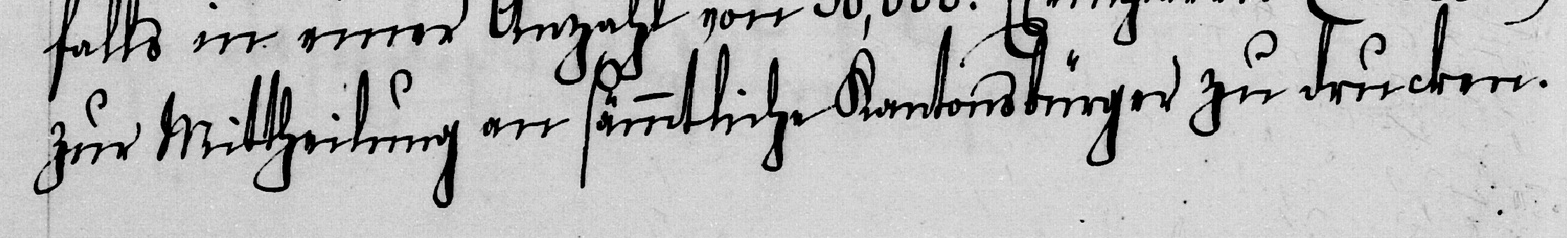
zur Mittheilung an sämmtliche Kantonsbürger zu drucken.
